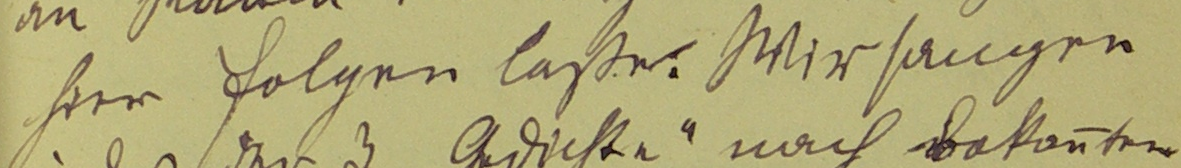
hier folgen laße, Wir sangen
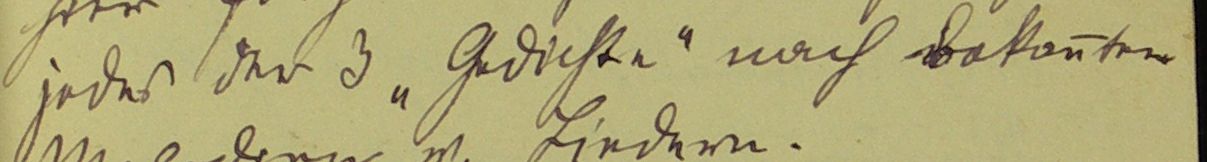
jedes der 3 „Gedichte“ nach bekannten
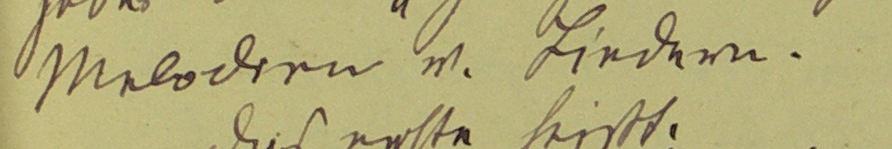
Melodien u. Liedern.
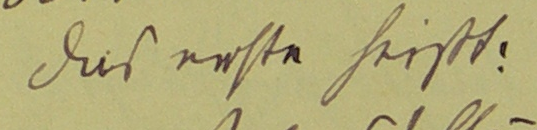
Das erste heißt:
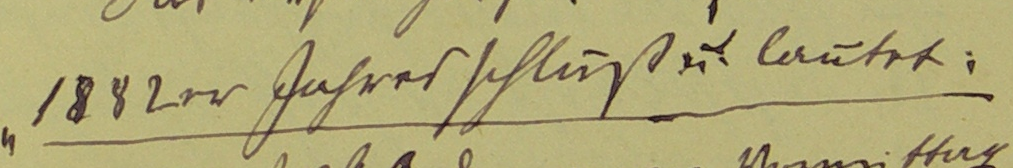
1882 er Jahresschluß u. lautet:
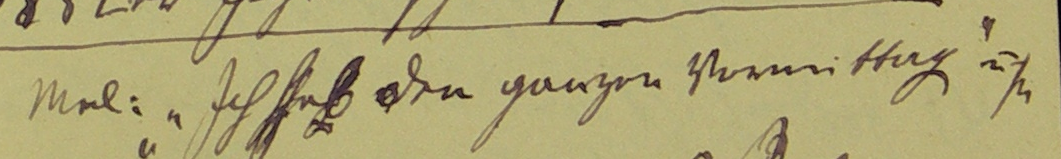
Mel :“ Ich hab den ganzen Vormittag“
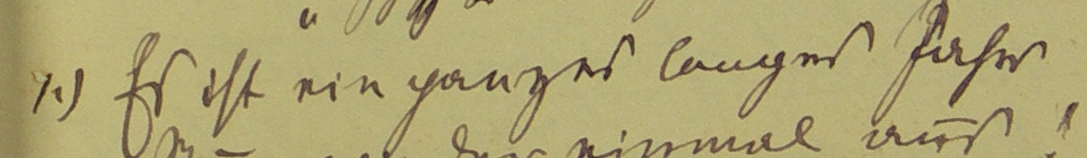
1.) Es ist ein ganzes langes Jahr
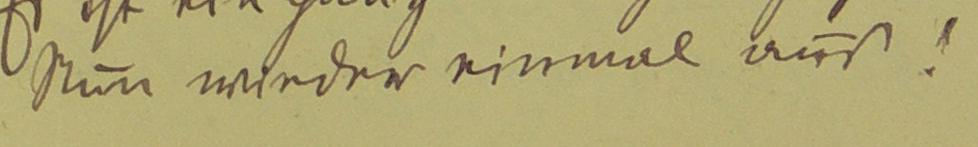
Nun wieder einmal aus.--
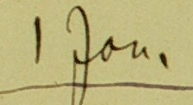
1 Jan.
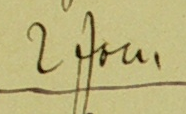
2. Jan
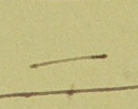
--
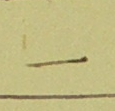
--
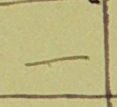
--
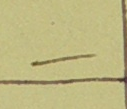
--
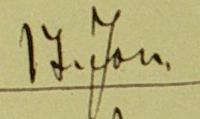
17. Jan
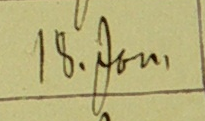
18. Jan.
